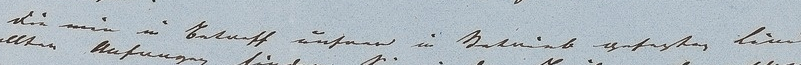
Die mir in Betreff unsrer in Betrieb gesezten Linien
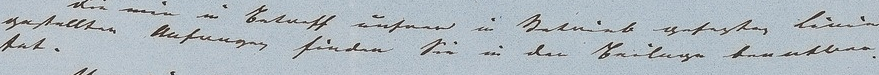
gestellten Anfragen finden Sie in der Beilage beantwor-
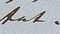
tet.
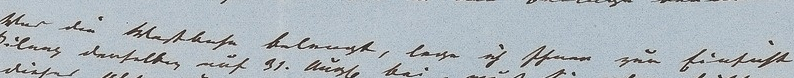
Was die Westbahn belangt, lege ich Ihnen zur Einsicht
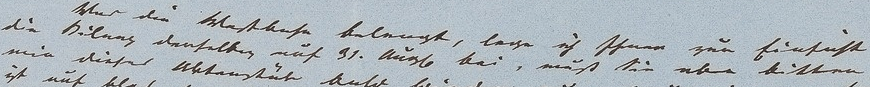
die Bilanz derselben auf 31. August. bei, muß Sie aber bitten,
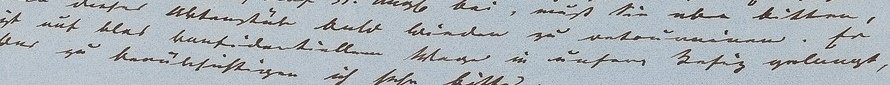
ist auf klar konfidentiellem Wege in unsern Besiz gelangt,
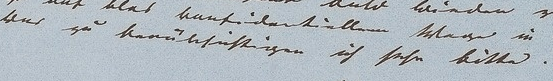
was zu berüksichtigen ich sehr bitte.
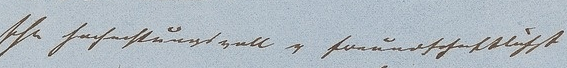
Ihr hochachtungsvoll & freundschaftlichst
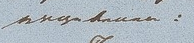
ergebener:
